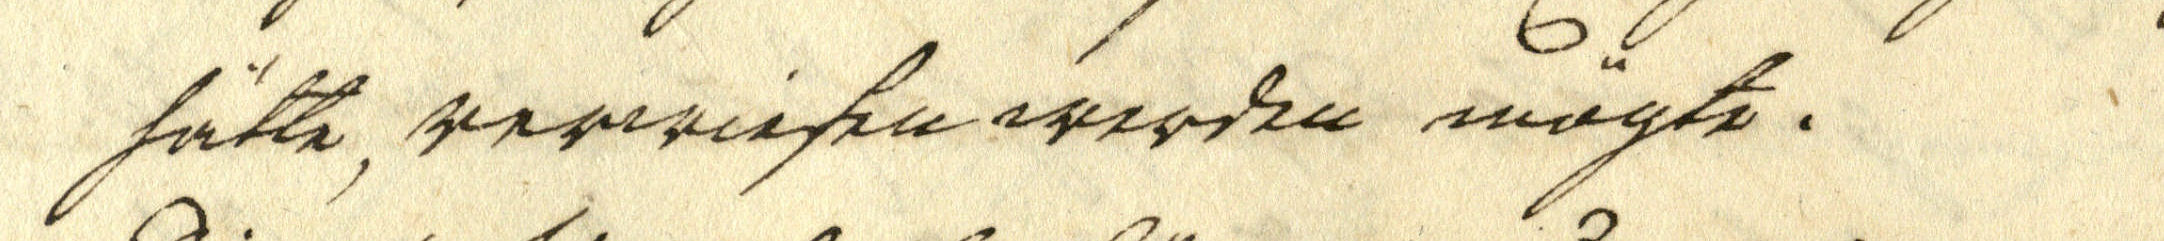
hätte, verwiesen werden mögte.
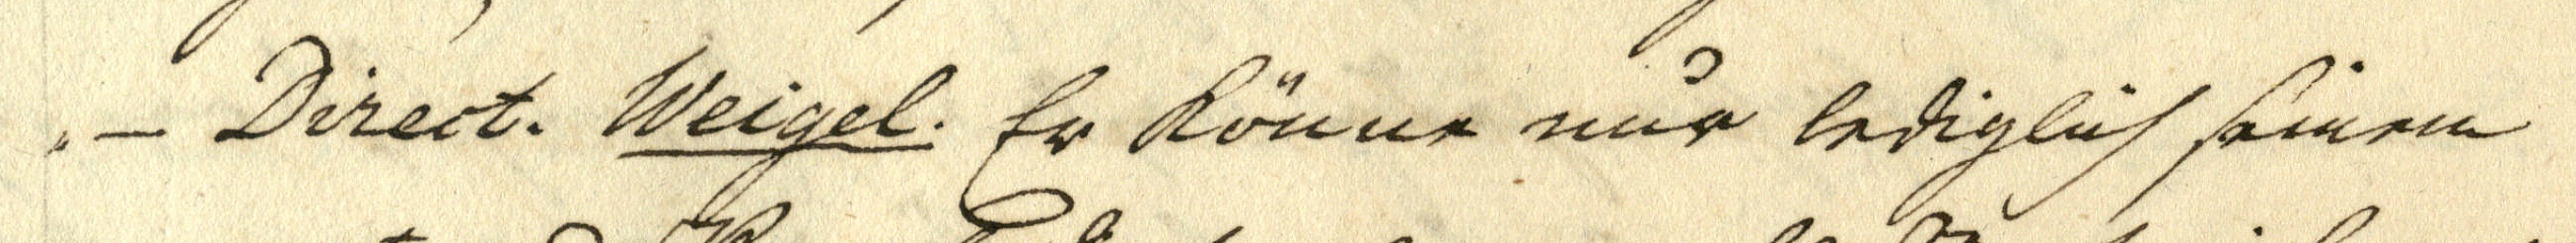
Direct. Weigel. Er könne nur lediglich seinem
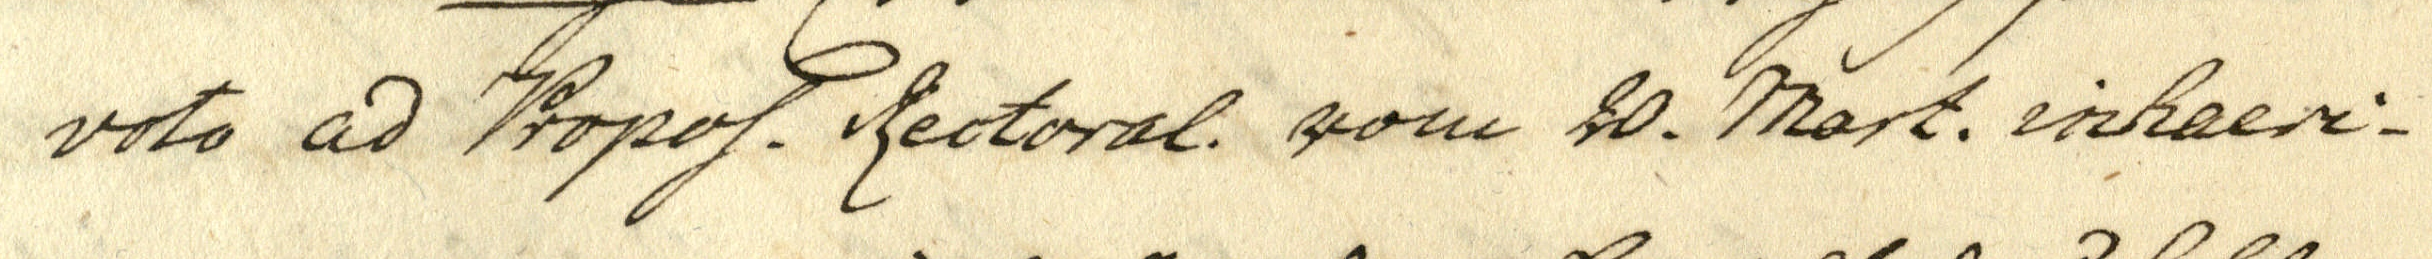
voto ad Propos. Rectoral. vom 20. Mart. inhaeri¬
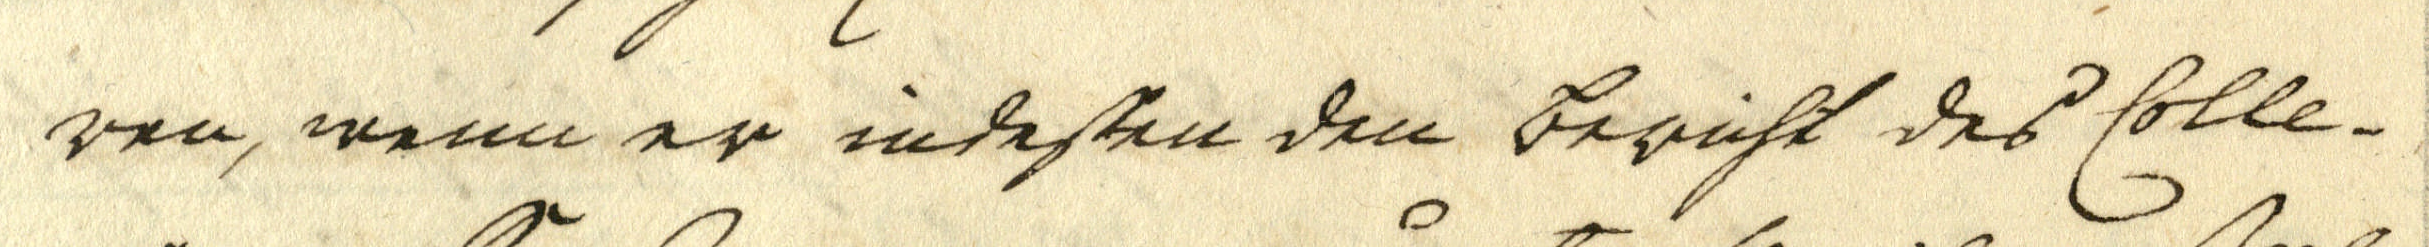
ren, wenn er indessen den Bericht des Colle¬
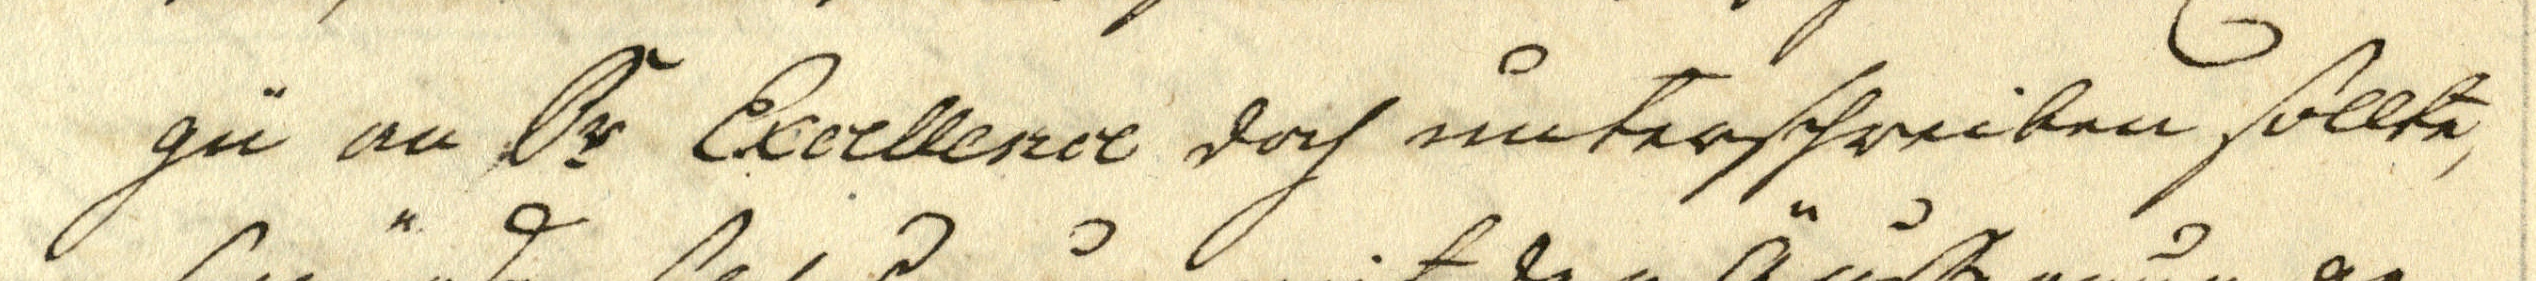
gii an Sr Excellence doch unterschreiben sollte,
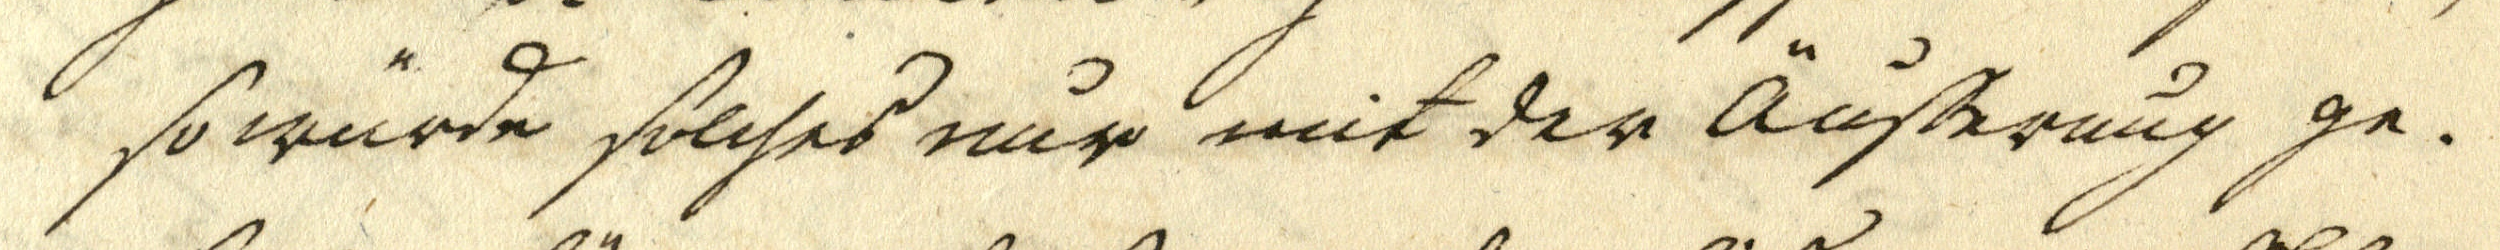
so würde solches nur mit der Äusserung ge¬
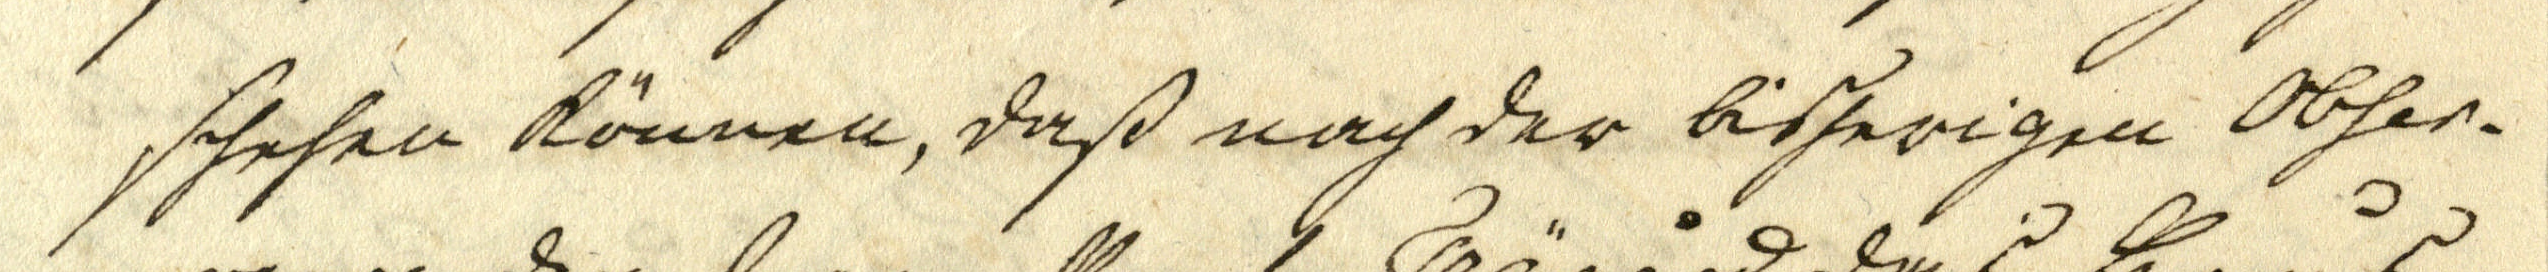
schehen können, daß nach der bisherigen Obser¬
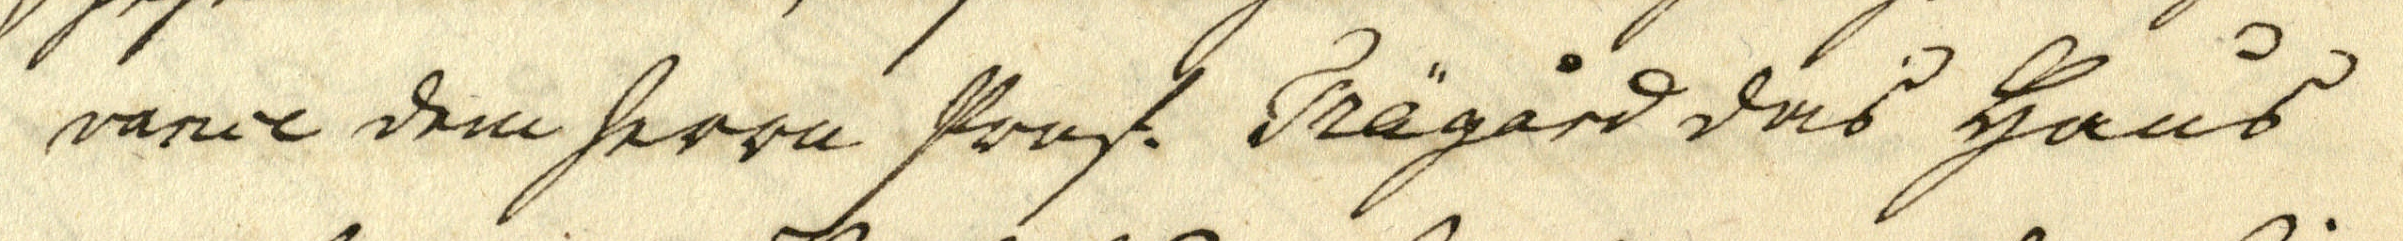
vance dem Herrn Prof. Trägård das Haus
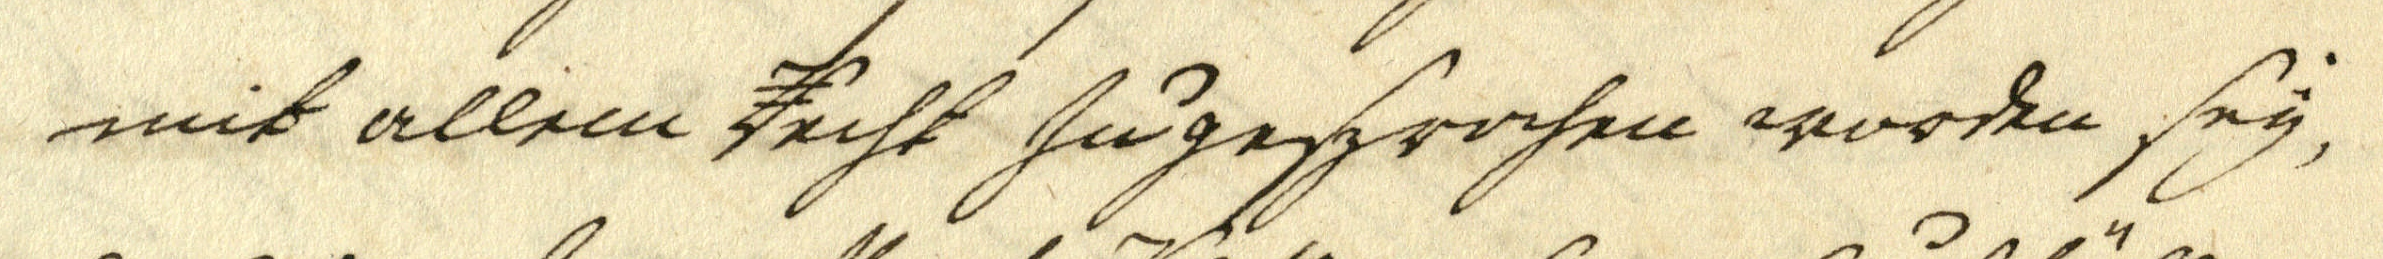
mit allem Recht zugesprochen worden seÿ,
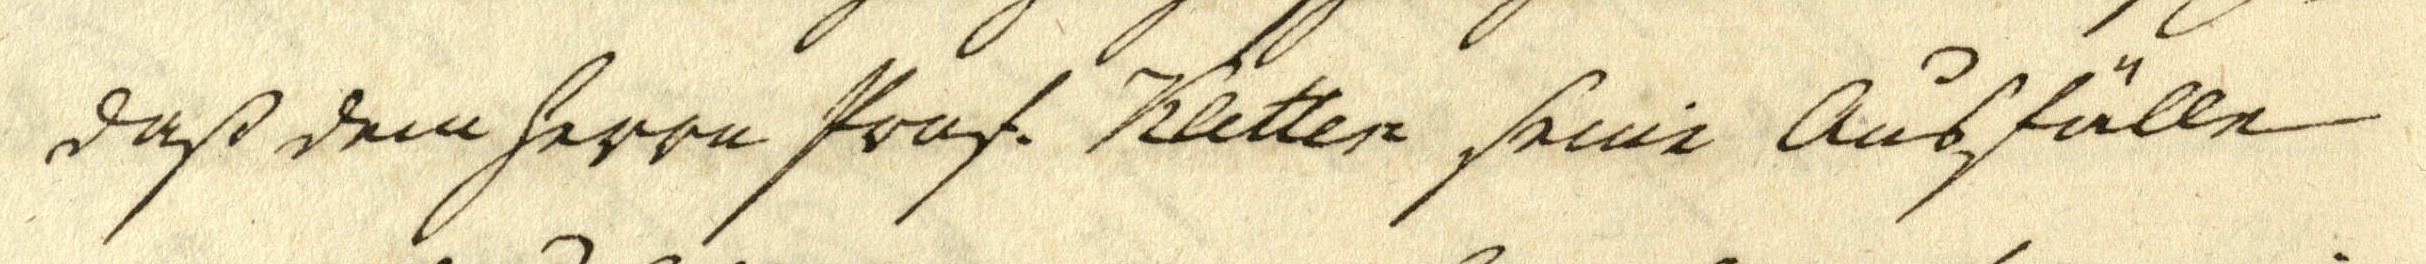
daß dem Herrn Prof. Kletten seine Ausfälle
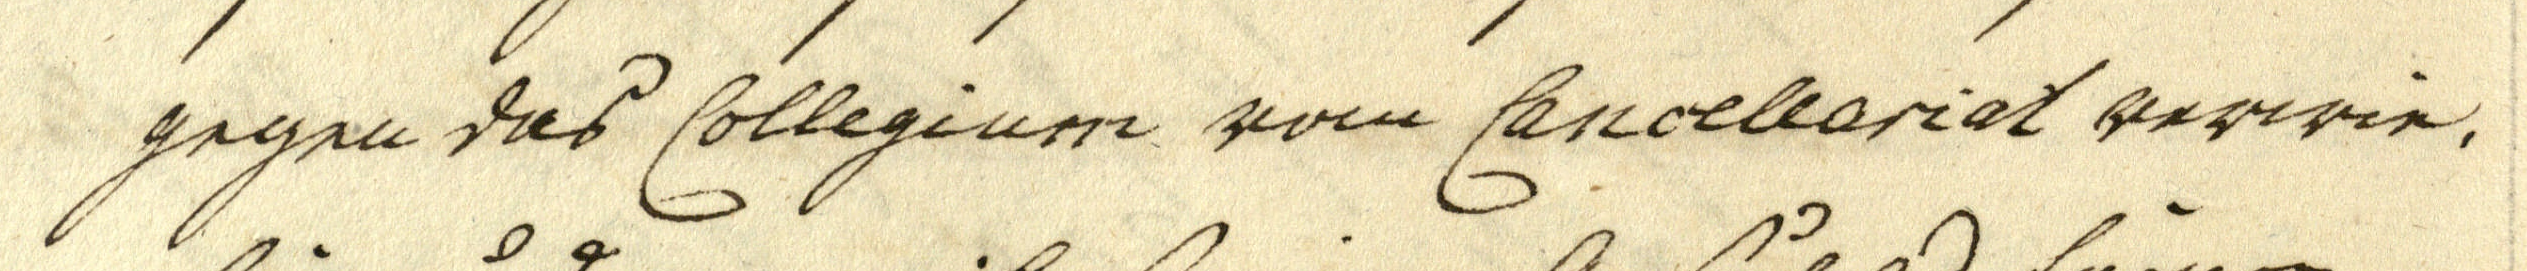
gegen das Collegium vom Cancellariat verwie¬
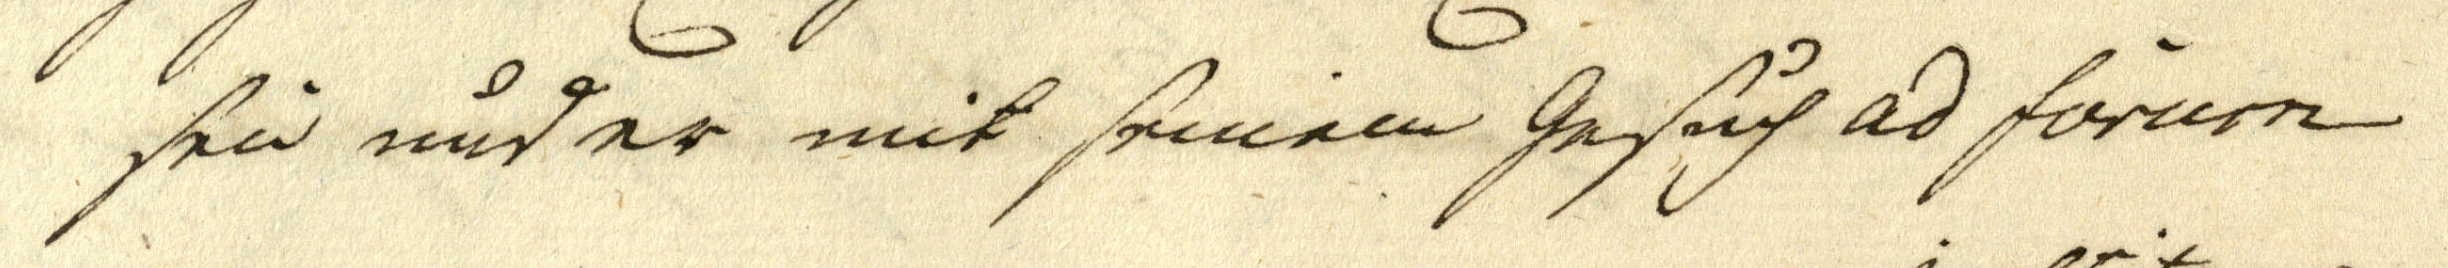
sen und er mit seinem Gesuch ad Forum
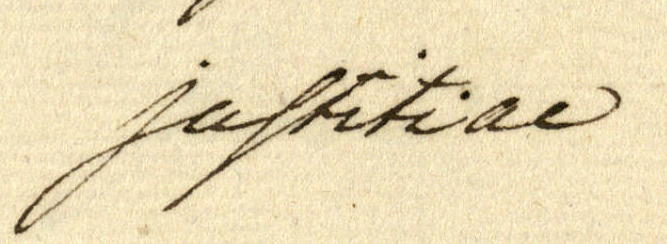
justitiae
